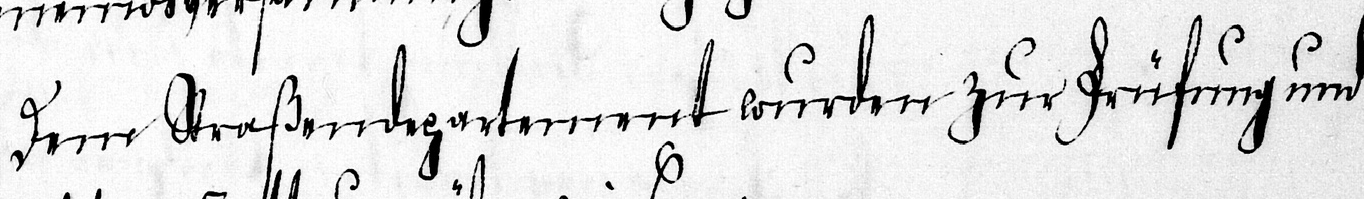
Dem Straßendepartement wurden zur Prüfung und
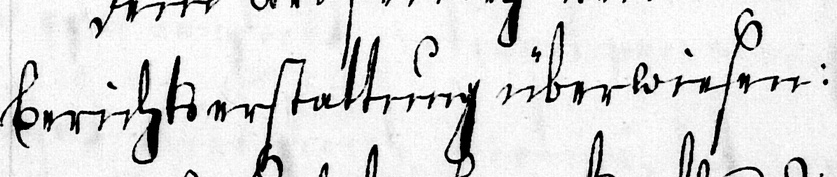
Berichtserstattung überwiesen:
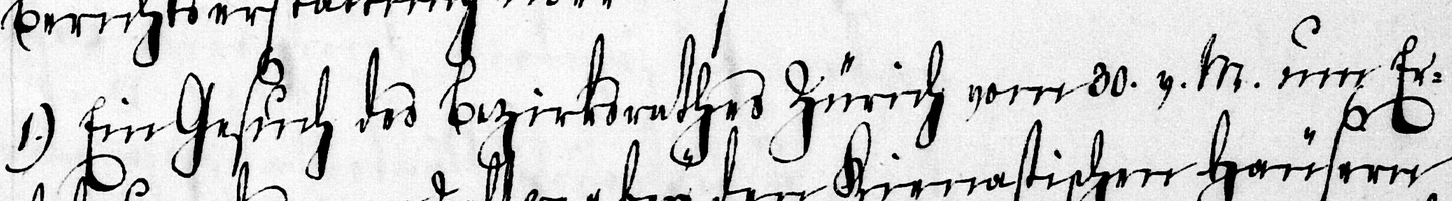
1.) Ein Gesuch des Bezirksrathes Zürich vom 30. v. M. um Er¬
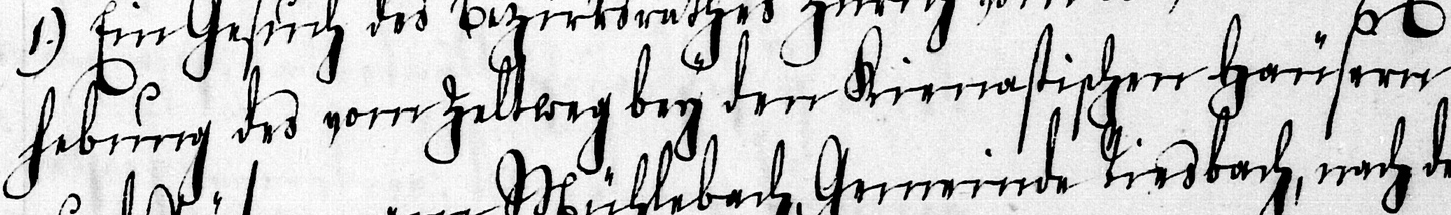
hebung des vom Zeltweg bey den Kienastischen Häusern
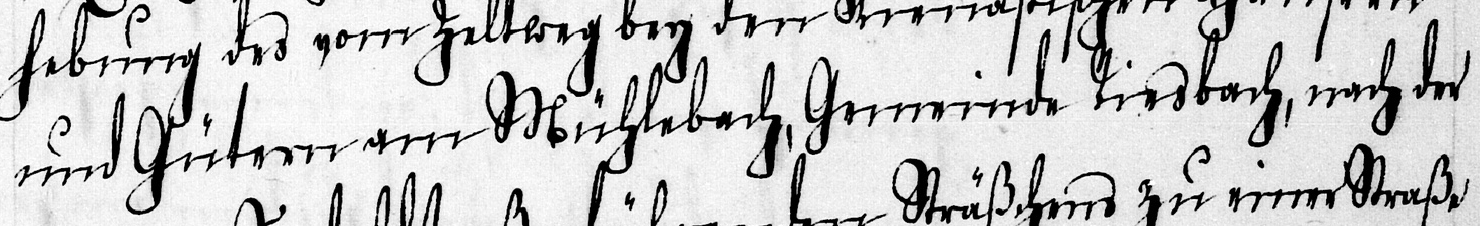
und Gütern am Mühlebach, Gemeinde Riesbach, nach der
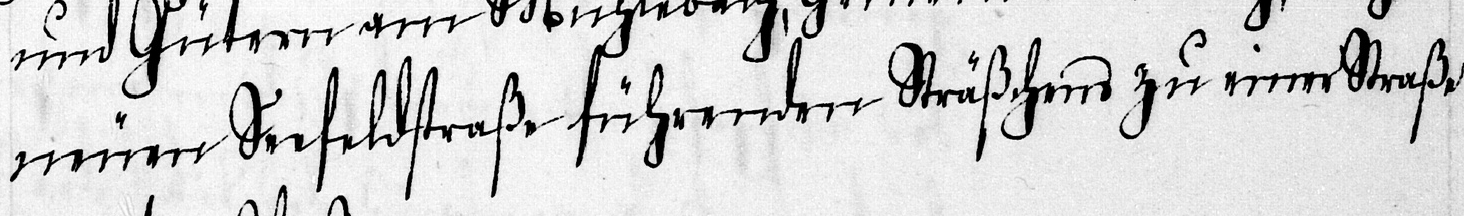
neuen Seefeldstraße führenden Sträßchens zu einer Straße
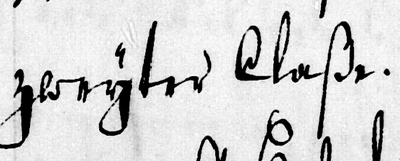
zweyter Claße.
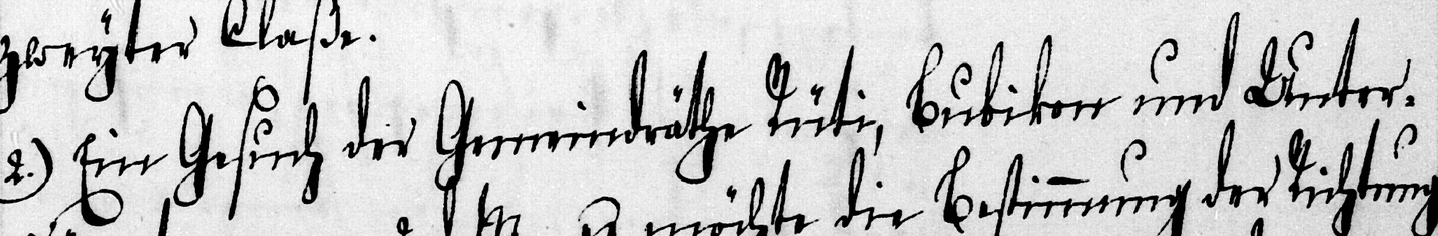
2.) Ein Gesuch der Gemeindräthe Rüti, Bubikon und Unter-D¬
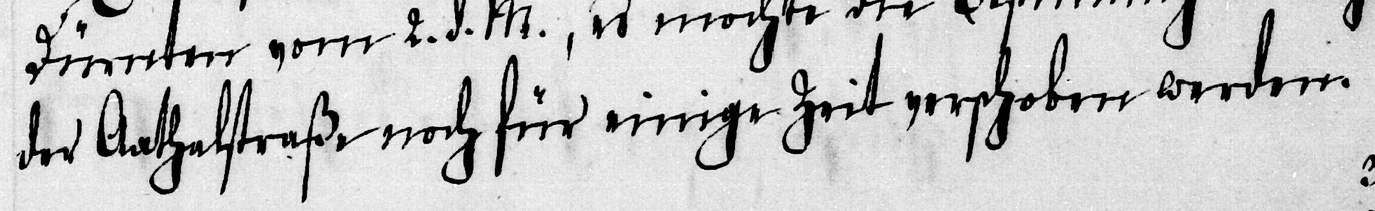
der Aathalstraße noch für einige Zeit verschoben werden.
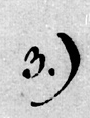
3.)
